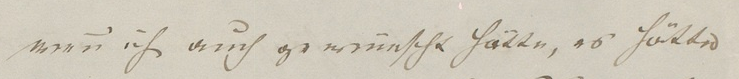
wenn ich auch gewünscht hätte, es hätte
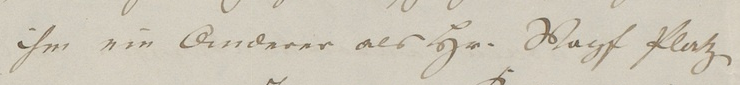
ihm ein Anderer als Hr. Wapf Platz
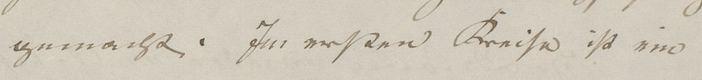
gemacht. Im ersten Kreise ist ein
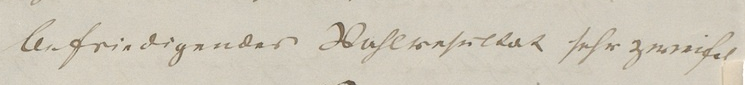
befriedigendes Wahlresultat sehr zweifel-
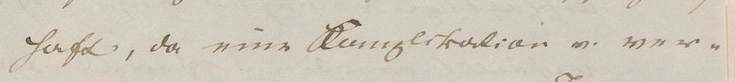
haft, da eine Komplikation v. ver-
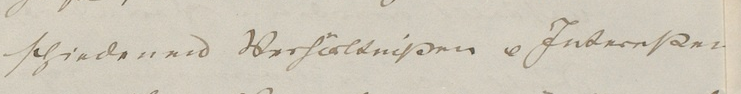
schiedenen Verhältnißen & Intereßen
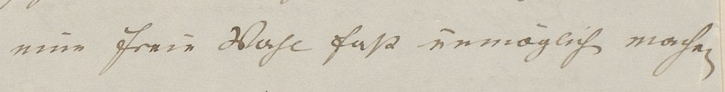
eine freie Wahl fast unmöglich machen.
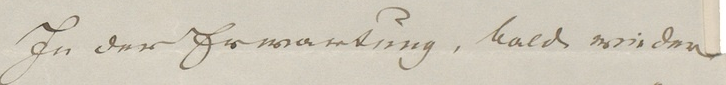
In der Erwartung, bald wieder
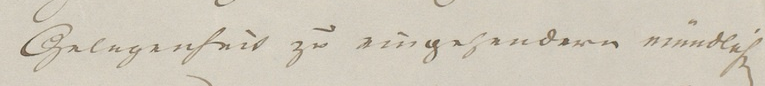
Gelegenheit zu eingehendern mündlichen
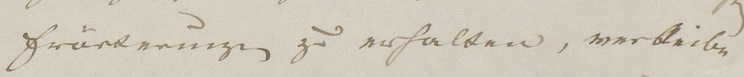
Erörterungen zu erhalten, verbleibe
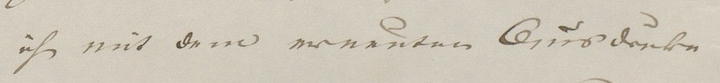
ich mit dem erneuten Ausdruke
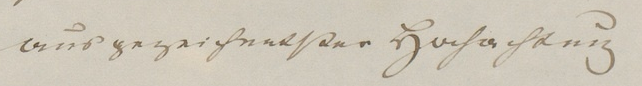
augezeichnetster Hochachtung
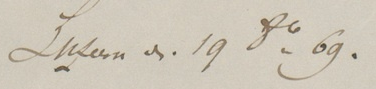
Luzern d. 19 8b 69.
